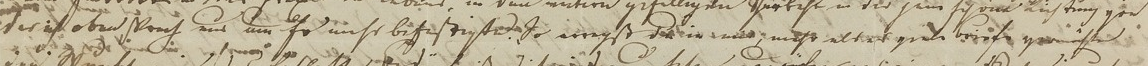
der ich oben sprach nur um so mehr befestigte. So erregst du in mir, mehr als es viele Briefe vermöchten
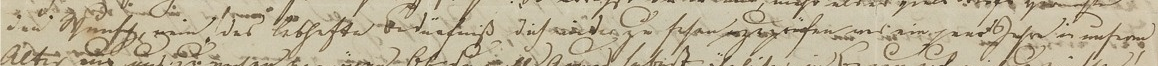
den Wunsch, nein, das lebhafte Bedürfniß dich wieder zu sehen & zu prüfen was ein paar Jahre in unserm
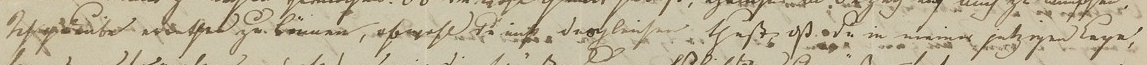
Ich glaube errathen zu können, obwohl du nicht desgleichen thust, dß du in meiner jetzigen Lage,
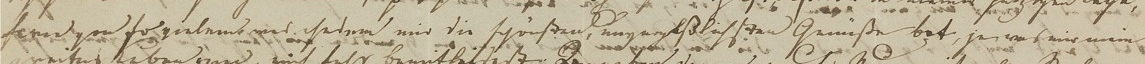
ferne von so vielem was ehedem mir die schönsten, unvergeßlichsten Genüße bot, ja was mir mein
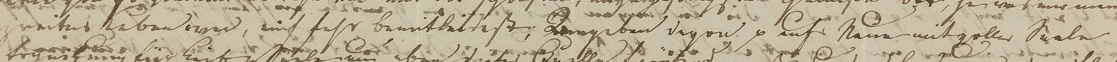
zweites Leben war, mich sehr bemitleidest; Umgeben davon & aufs Neue mit voller Seele
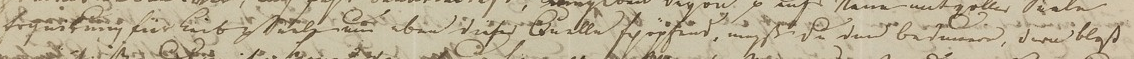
Erquikung für Leib & Seele aus eben dieser Quelle schöpfend, magst du den bedauern, dem bloß
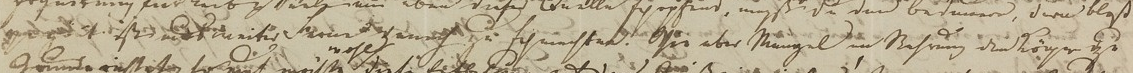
vergönnt ist aus weiter Ferne danach zu schmachten. Wie aber Mangel an Nahrung den Körper zu
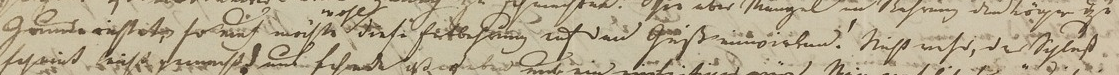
Grunde richtet, so auch möchte wohl diese Entbehrung auf den Geist einwirken! Nicht wahr, der Schluß
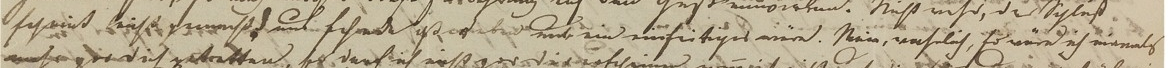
scheint leicht gemacht! nur schade dß es eben nur ein einseitiger wäre. Nein, wahrlich, so wäre ich niemals
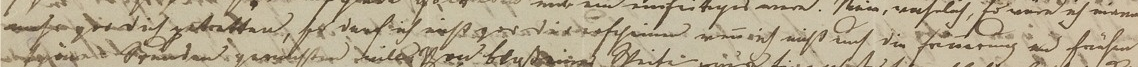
mehr vor dich getretten, so darf ich nicht vor dir erscheinen wenn ich nicht auch die Erinnerung an frühere
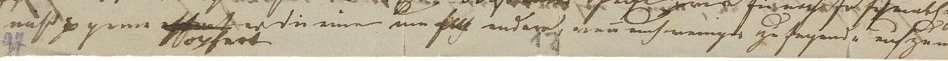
gerne ...ertopfert er die eine um sich andere, wenn auch weniger zusagende aufzunehmen.
